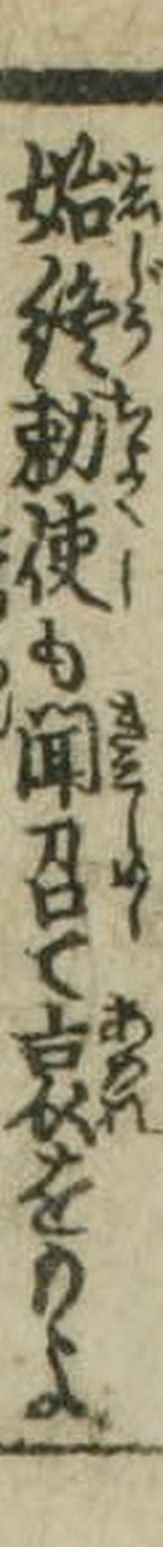始終勅使も聞召て哀をもよ
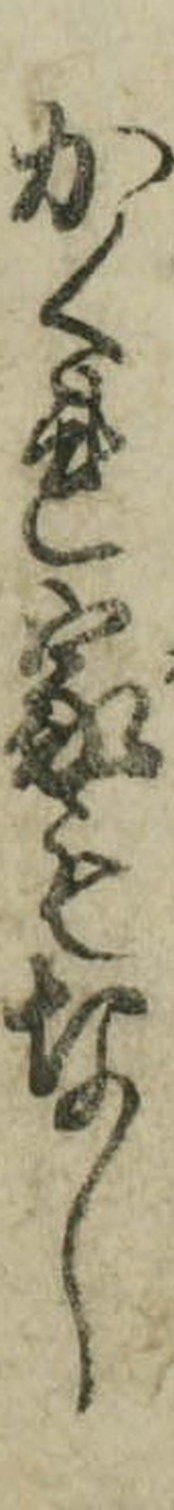かくれ家もなし
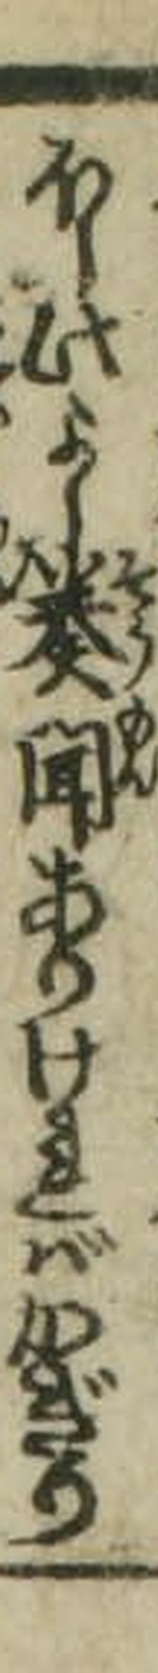ほし此よし奏聞ありければかぎり
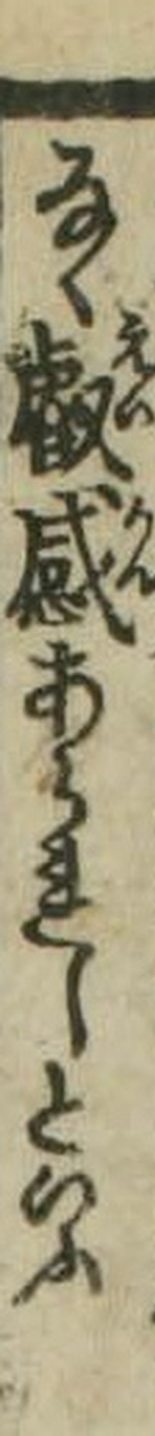なく叡感あられしといふ
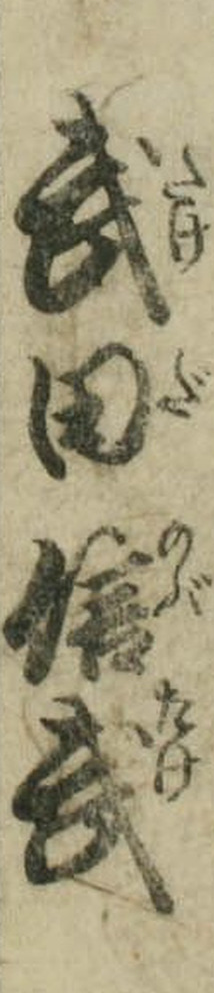武田信武
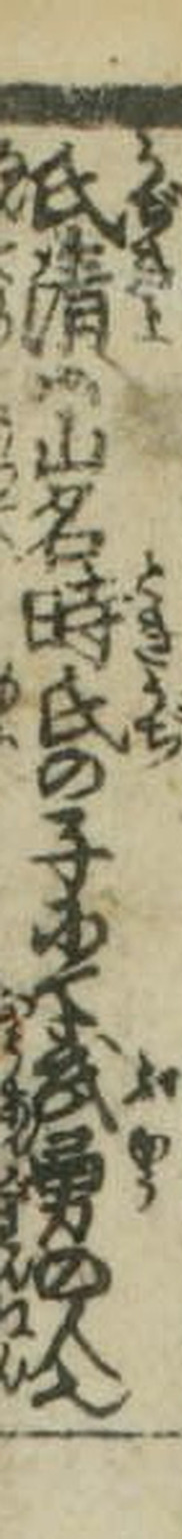氏清は山名時氏の子にて武勇の人也
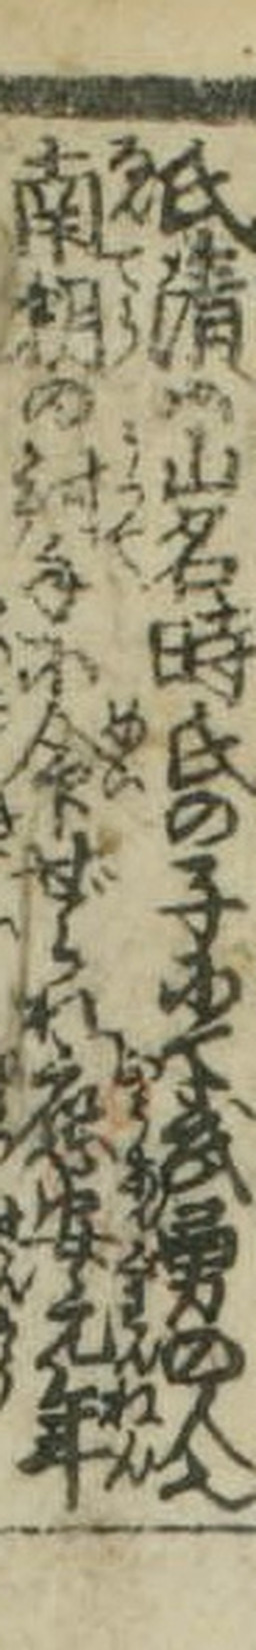南朝の討手に命ぜられ応安元年
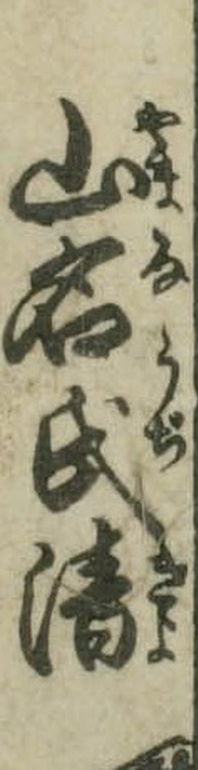山名氏清
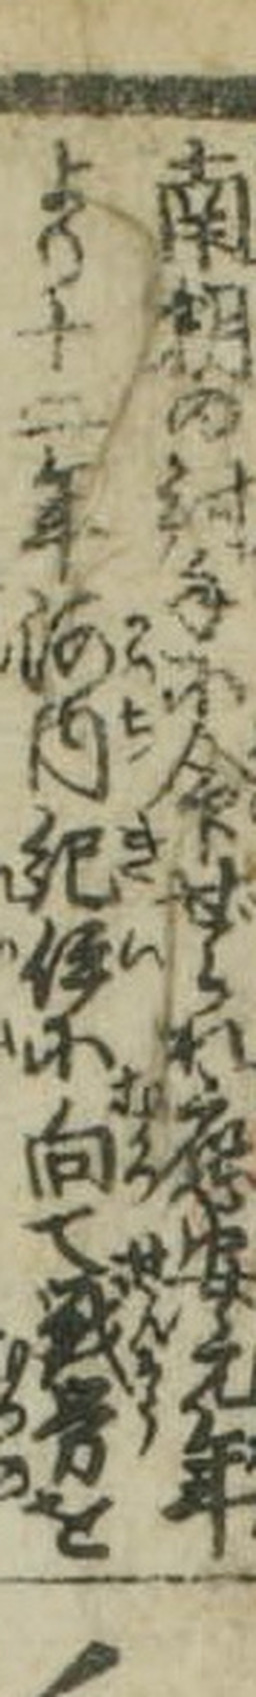より十二年河内紀伊に向て戦労を
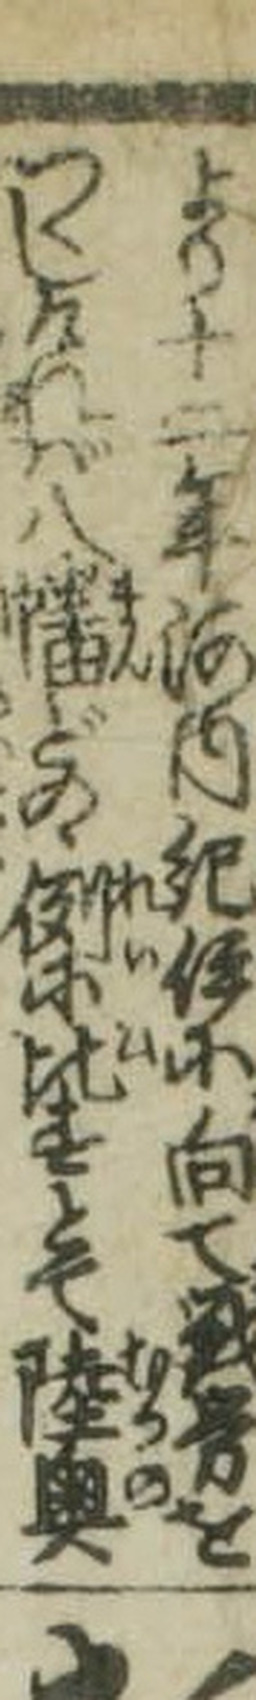つくしければ八幡どのゝ例に比すとて陸奥
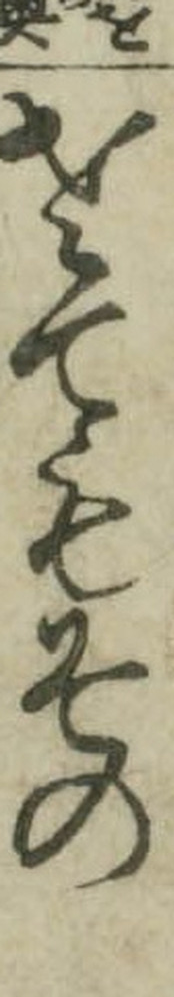さてもその
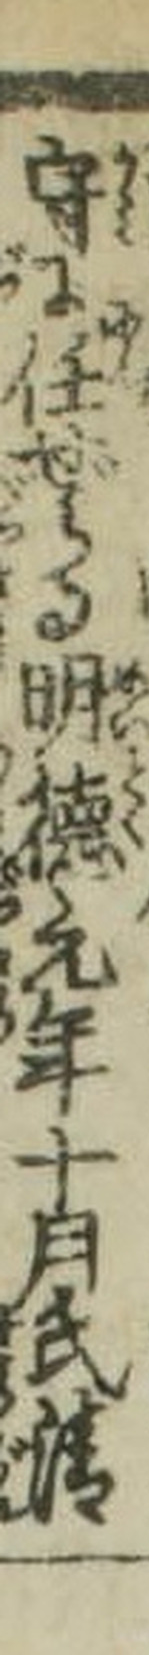守に任ぜらる明徳元年十月氏清
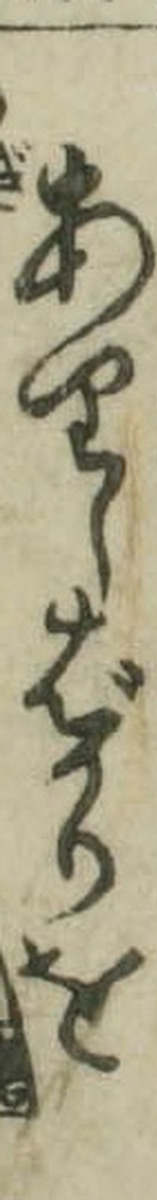ありしばかりを
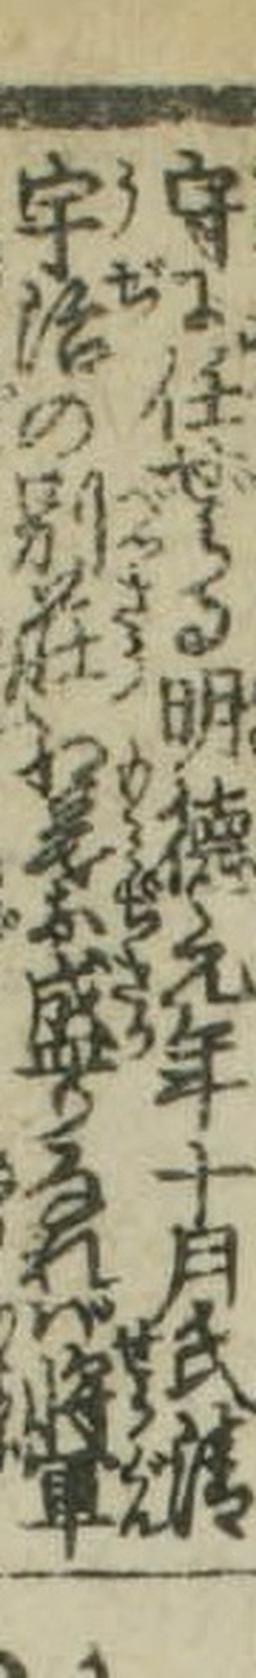宇治の別荘紅葉盛りなれば将軍
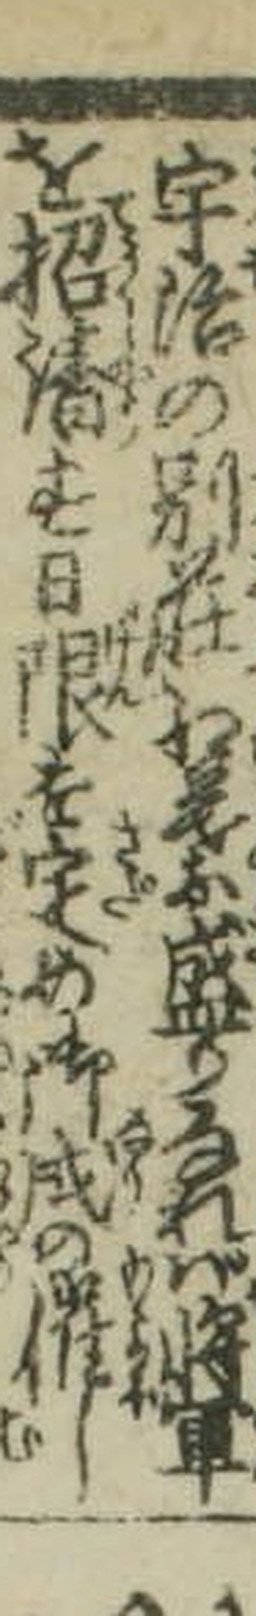を招請す日限を定め御成の催し
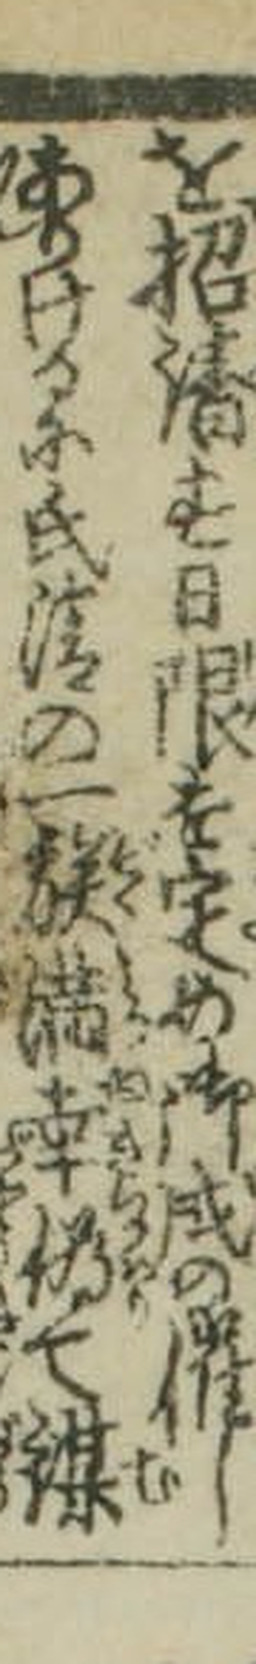ありけるに氏清の一族満幸偽て謀
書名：續英雄百人一首
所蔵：東京学芸大学附属図書館
